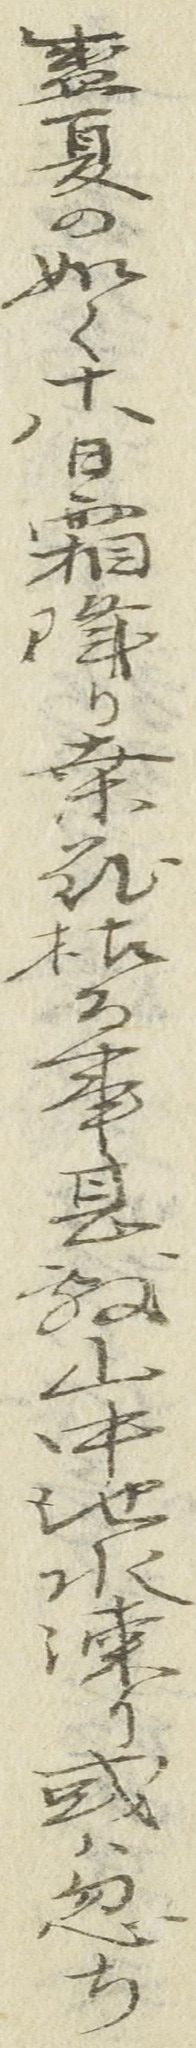盛夏の如く十八日霜降り桑花枯る事甚敷山中池水凍り或は忽ち
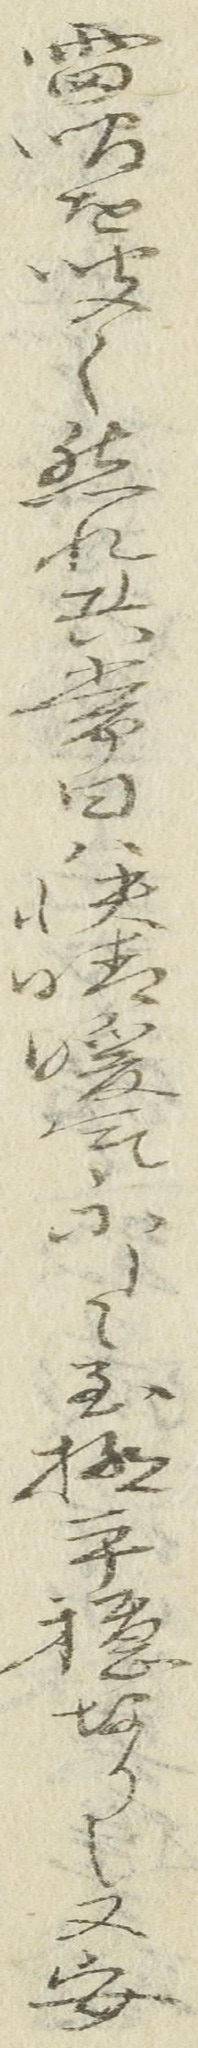雷鳴を聞く然れ共常日は快晴暖気にして至極平穏なりし又安
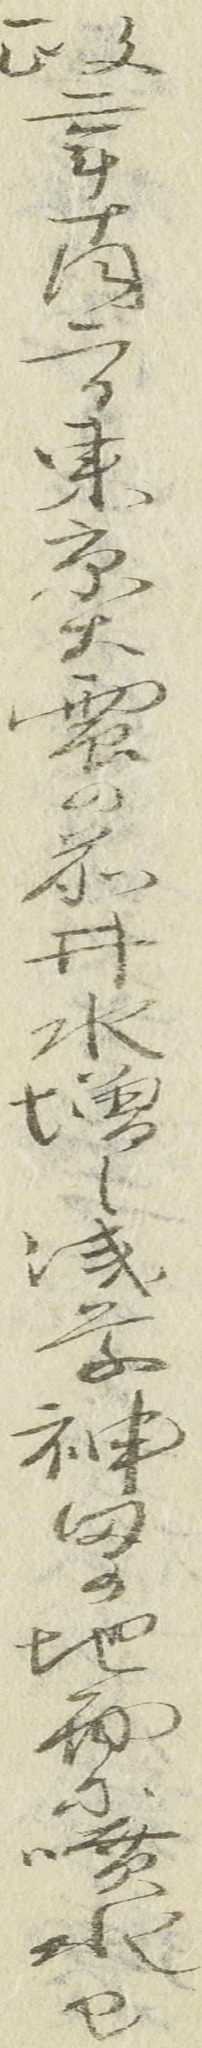政二年十月二日東京大震の前井水増し浅草神田の地面に噴水せ
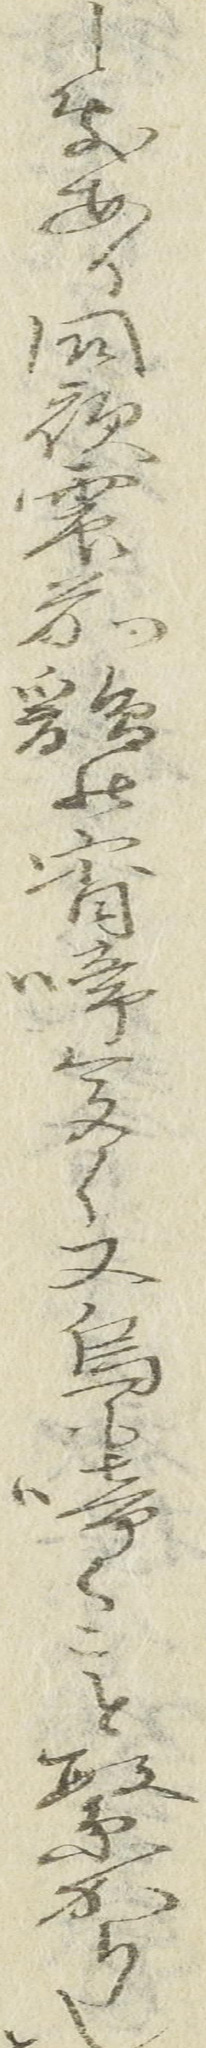し処あり同夜震前鶏の宵啼多く又烏も啼くこと繁かりしと
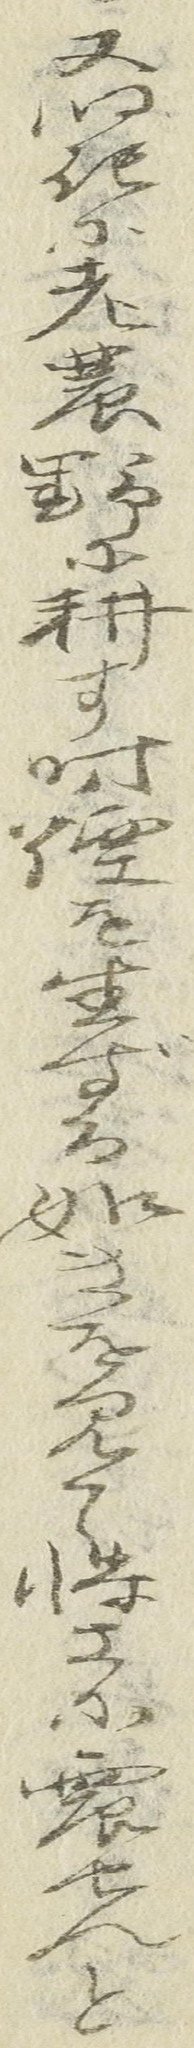一又旧記に老農野に耕す時煙を生ずる如きを見て将さに震せんと
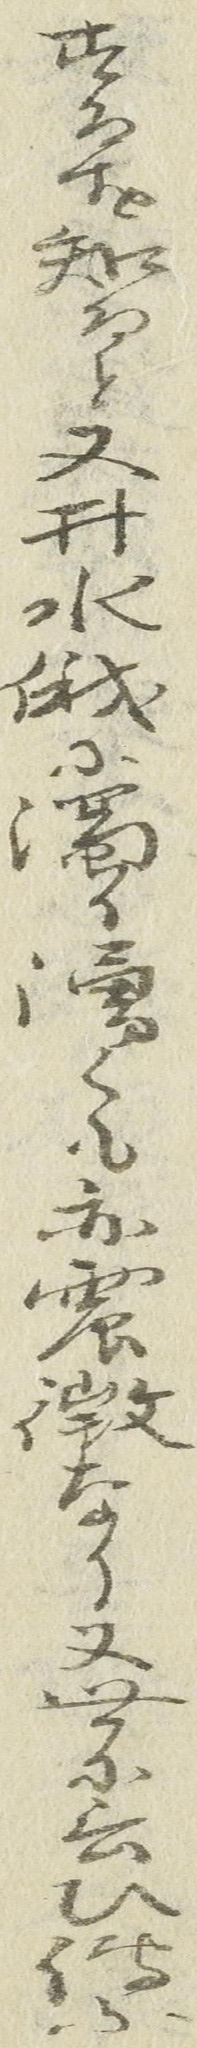するを知ると又井水俄に濁り湧くも亦震徴なり又世に云ひ伝ふ
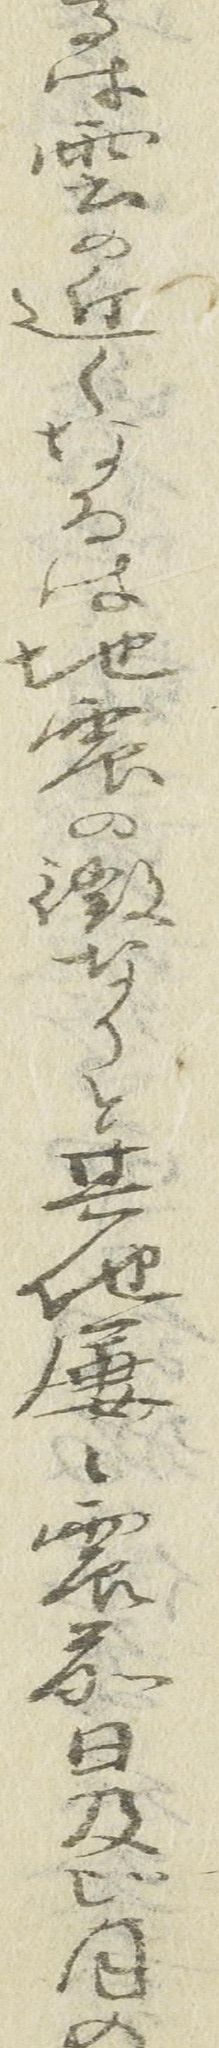るは雲の近くなるは地震の徴なりと其他屡々震前日及び月の
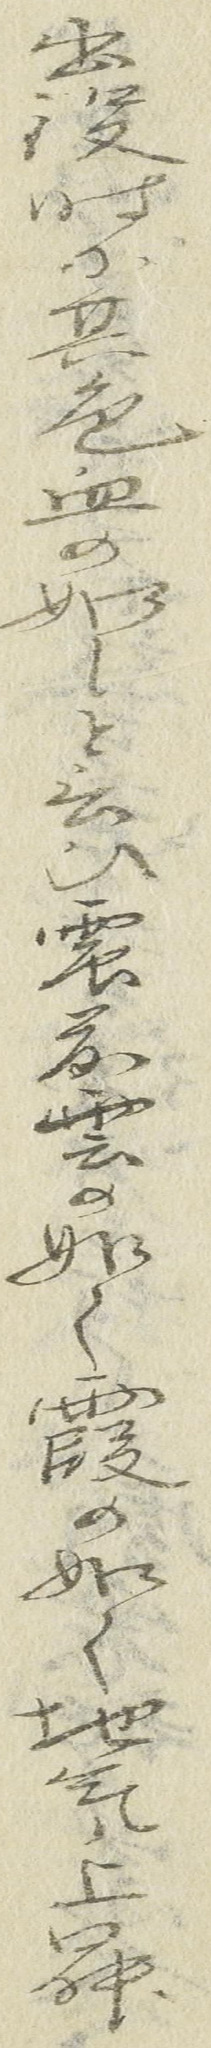出没時に其色血の如しと云ひ震前雲の如く霞の如く地気上昇
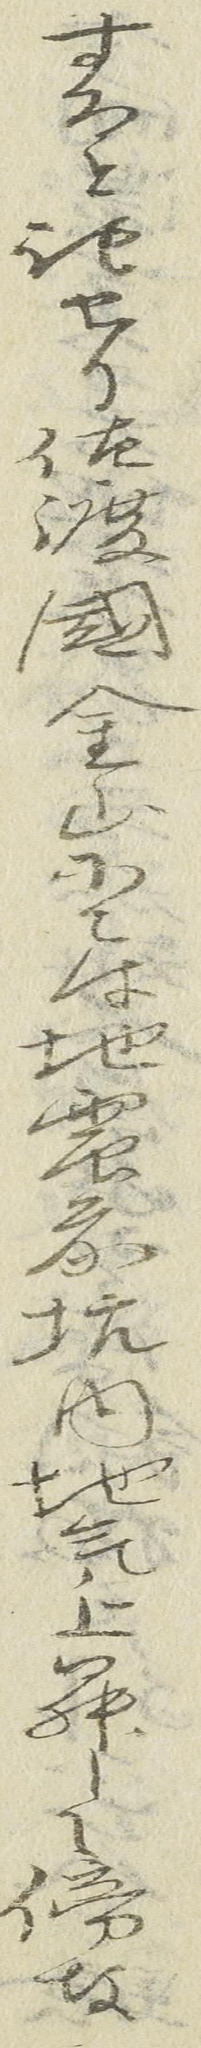すると記せり佐渡国金山にては地震前坑内地気上昇して傍な
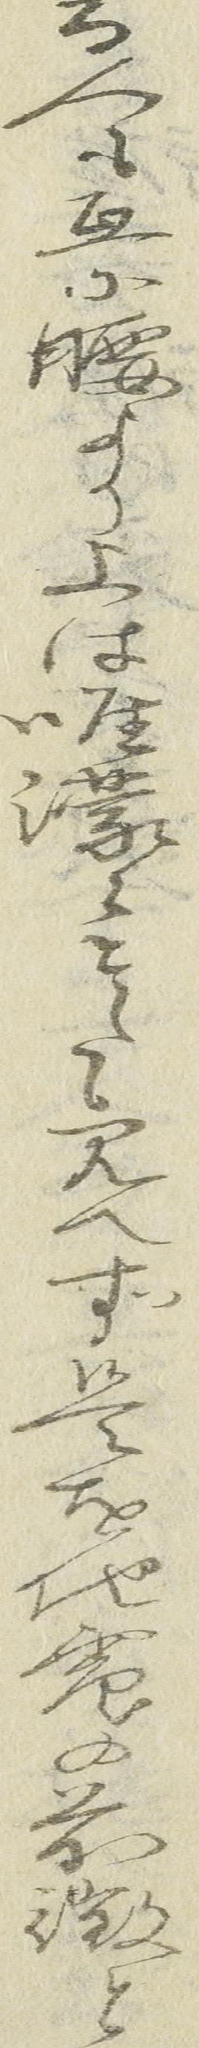る人も互に腰より上は唯濛々として見へず是を地震の前徴と

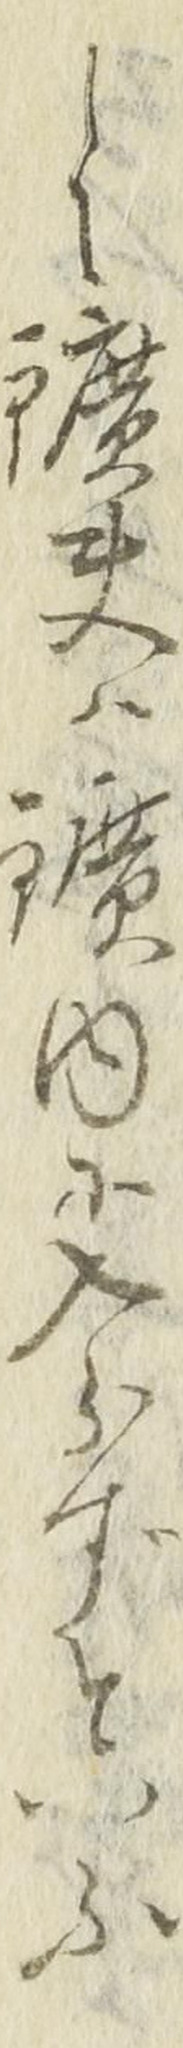して鉱夫は鉱内に入らずといふ
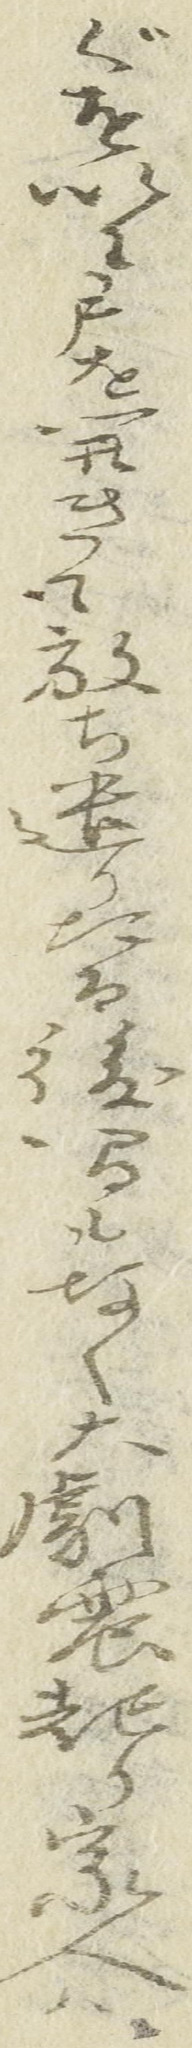ぐを以て戸を開きて放ち遣りたる後間もなく大劇震起り家人は
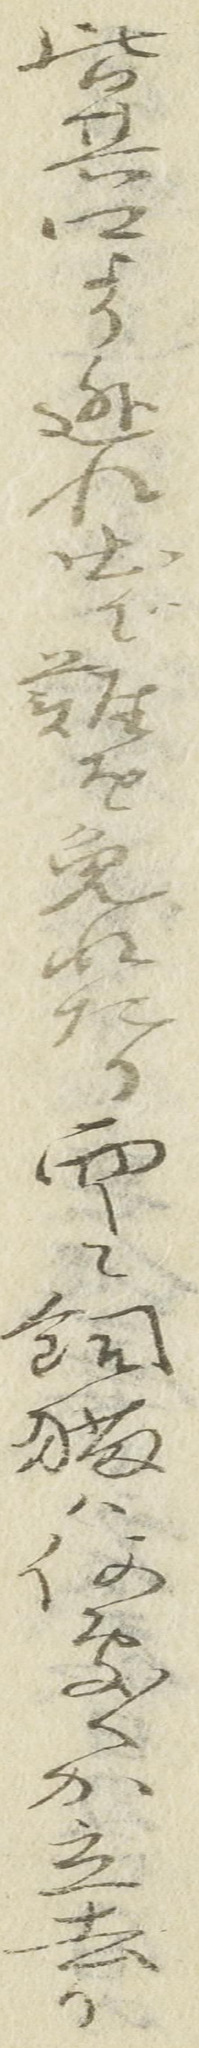皆其口より逃れ出で難を免れたり而して飼猫は何処へか立去り
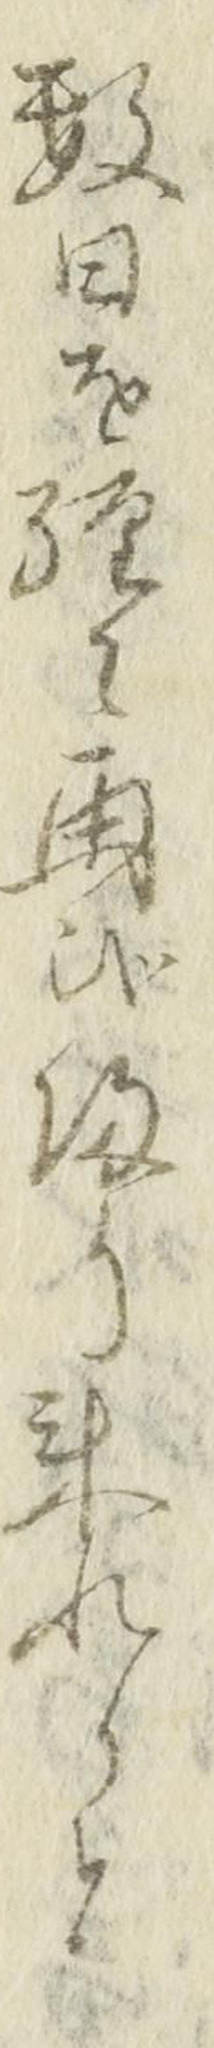数日を経て再び帰り来れりと
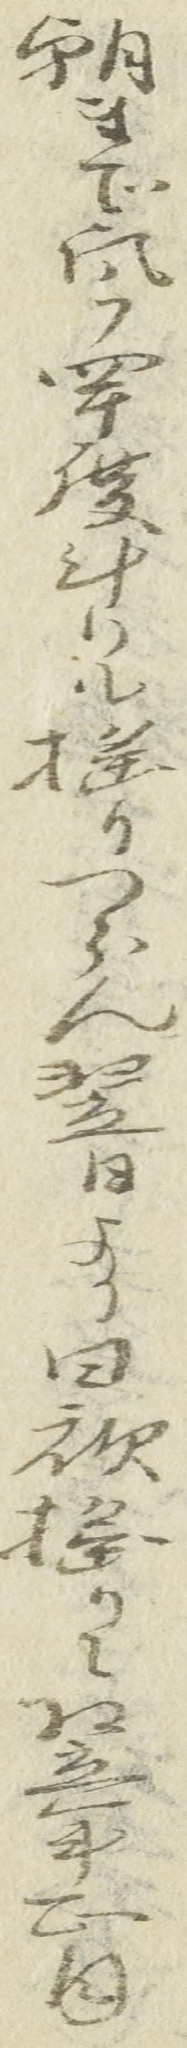朝まで凡ソ四十度計りも揺りつらん翌日より日夜揺りて翌年正月
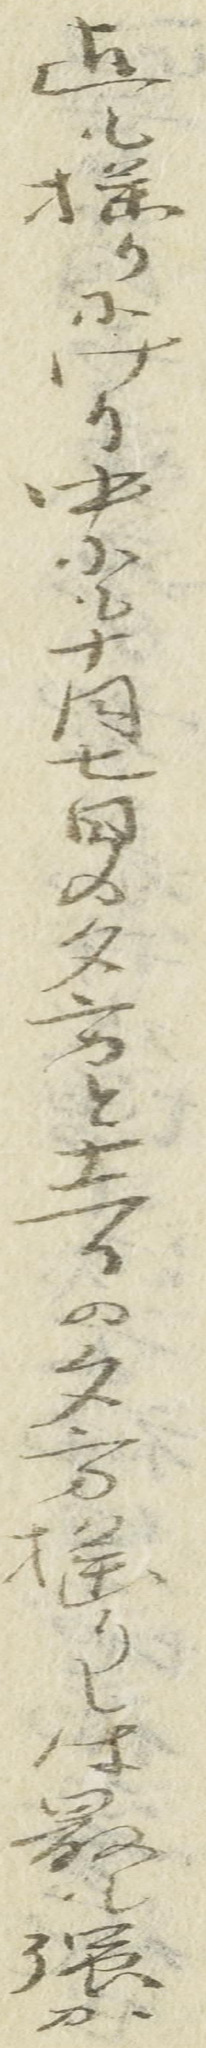迄も揺りにけり中にも十月七日の夕方と十二日の夕方揺りしは最も強か
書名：地震前兆集　全
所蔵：東京大学地震研究所図書室 Earthquake Research Institute Library, The University of Tokyo, JAPAN
